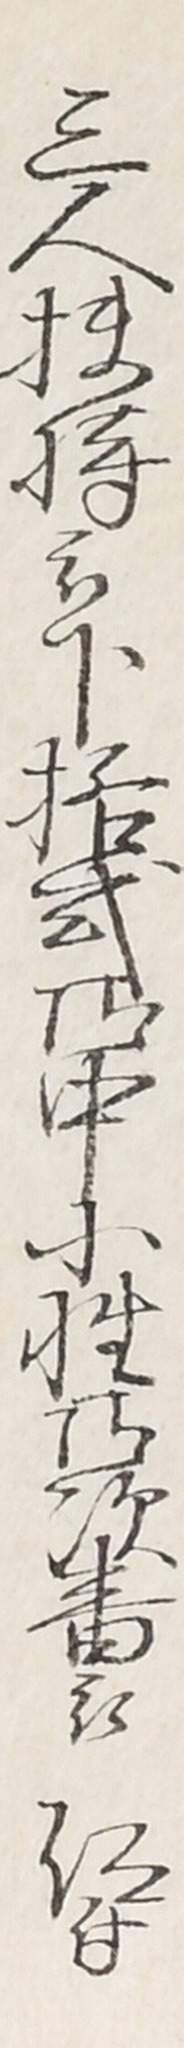三人扶持被下格式御中小性御次番被仰付
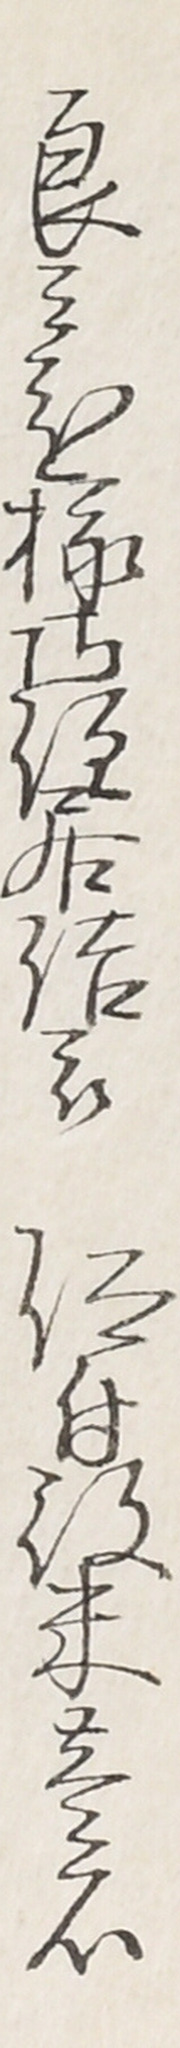良之進様御住居詰被仰付役米壱石
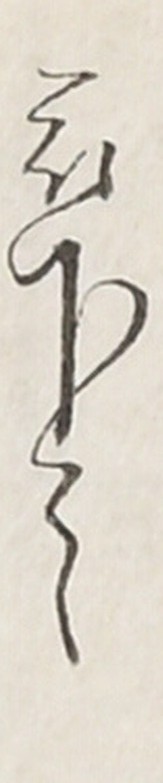被下之
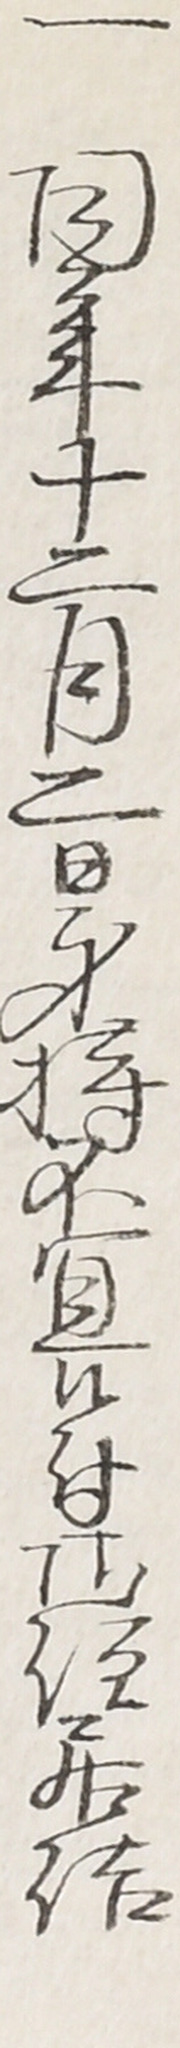一同年十二月二日身持不宜候付御住居詰
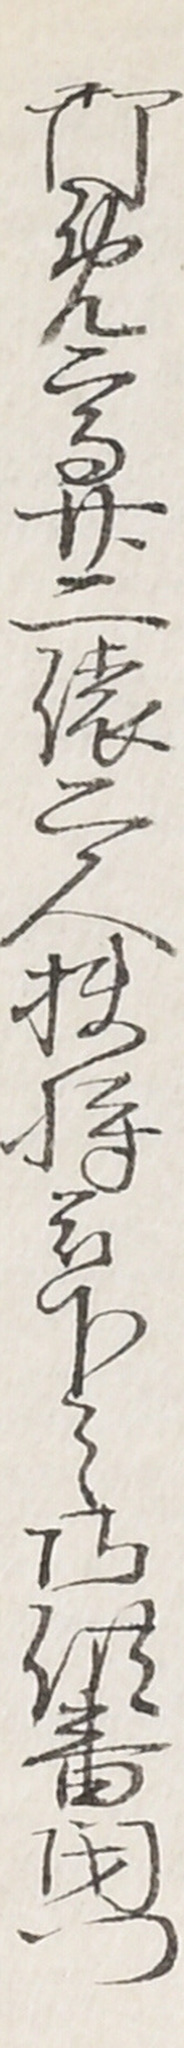御免高廿二俵二人扶持被下之御供番閉門
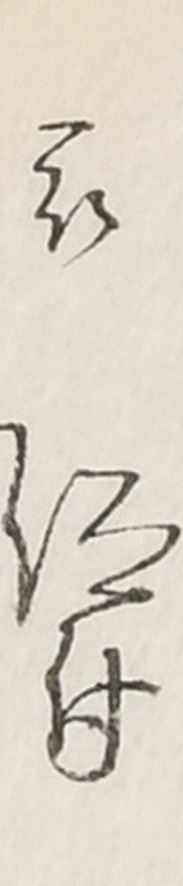被仰付
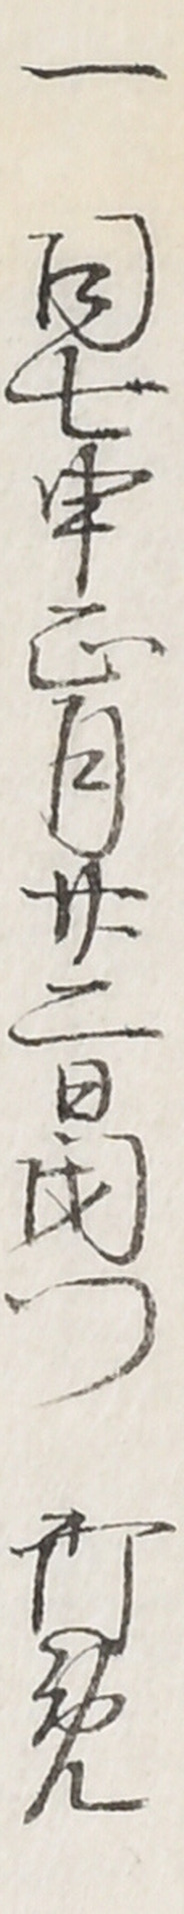一同七年申正月廿二日閉門御免
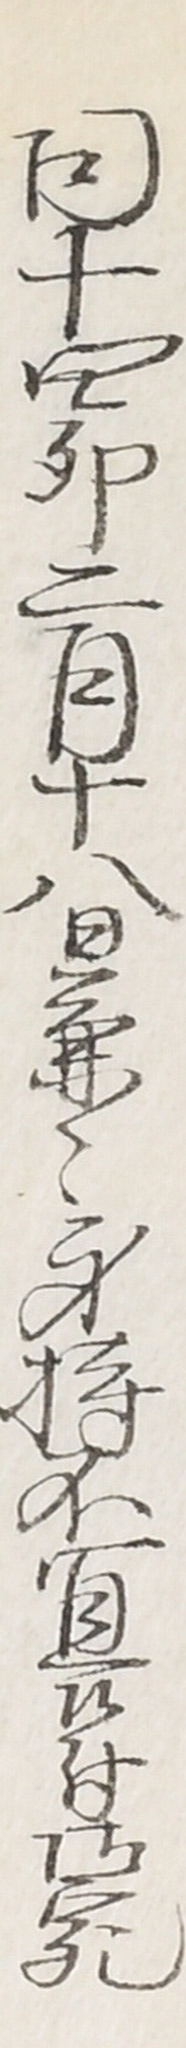一同十四卯二月十八日兼々身持不宜候付御宛
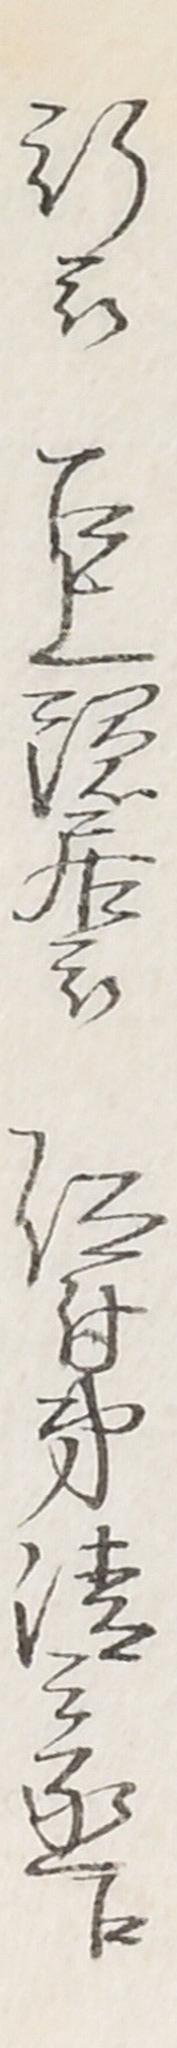行被召上隠居被仰付弟清之丞江
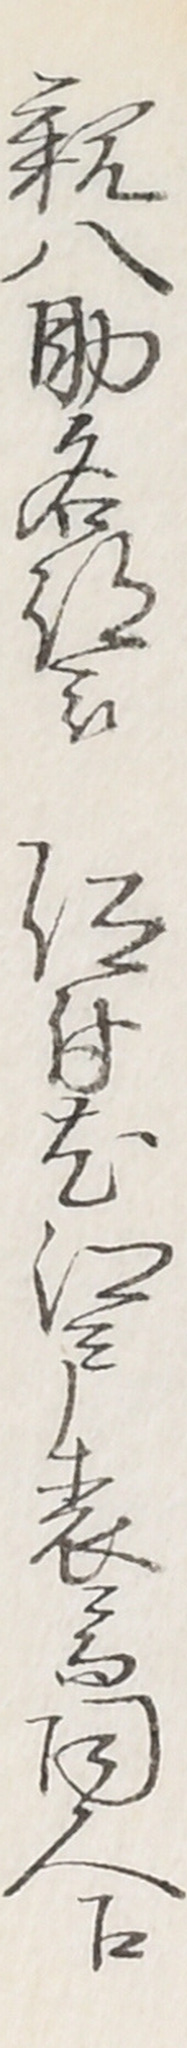親八助名跡被仰付尤江戸表ニ而同人江
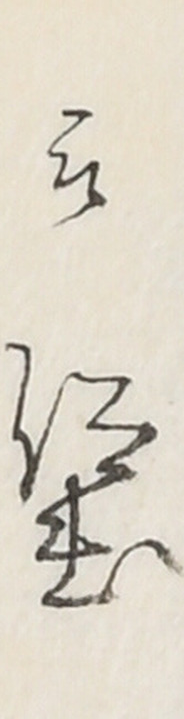被仰出
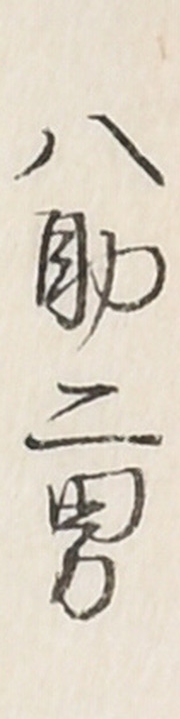八助二男
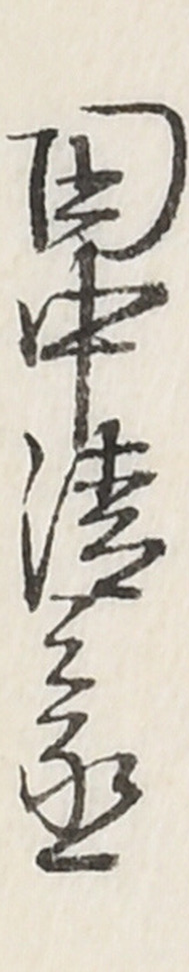田中清之丞
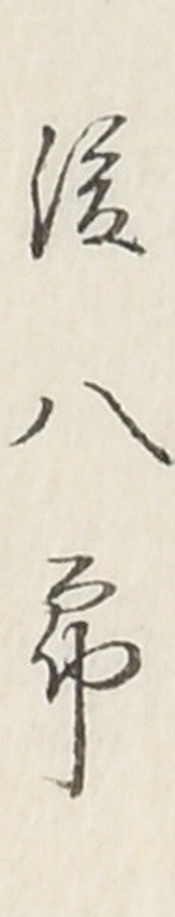後八郎
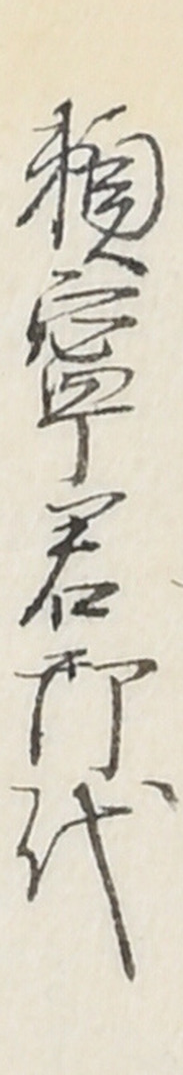頼寧君御代
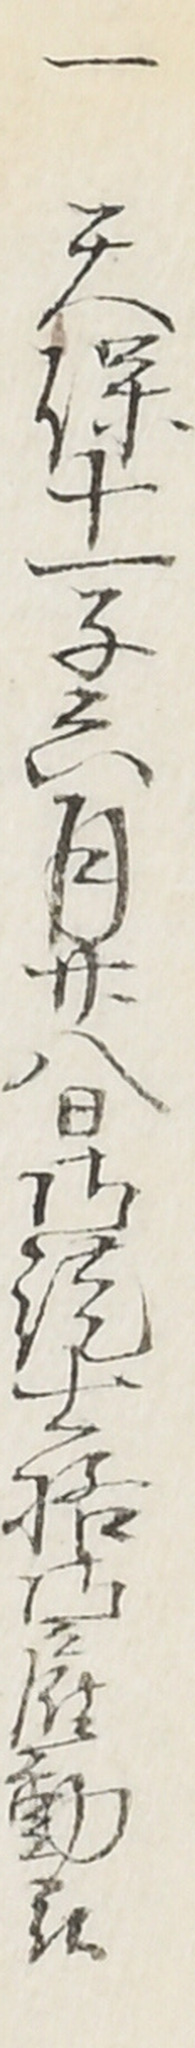一天保十一子六月廿八日御徒士格御雇勤被
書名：給人諸士勤仕録（七）
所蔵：伊那市立高遠町図書館・合同会社AMANE
